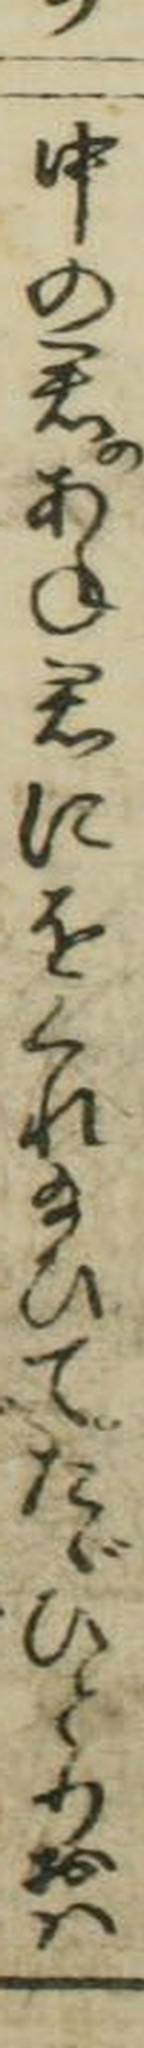中の君のあね君にをくれ給ひて。たゞひとりおは
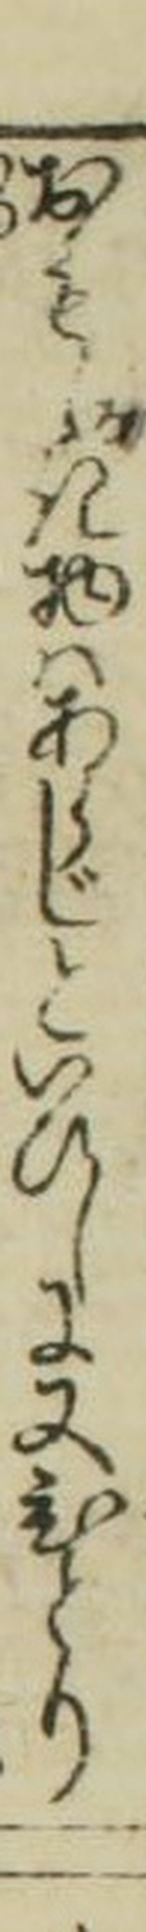おもしろき物はあらじといひしに又ひとり
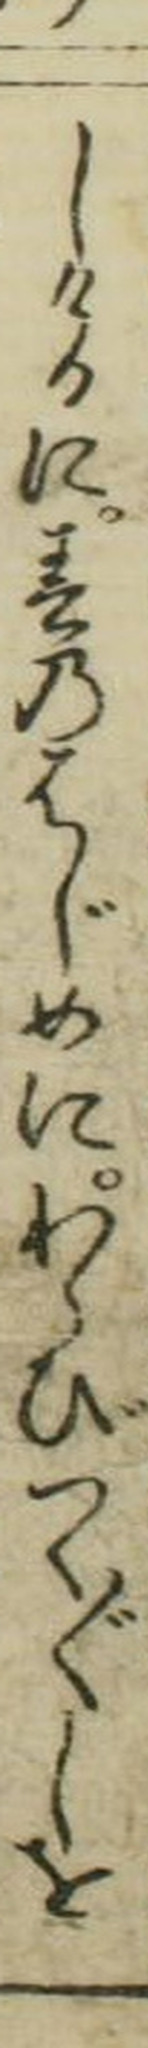しけるに。春のはじめに。わらびつく〴〵しを
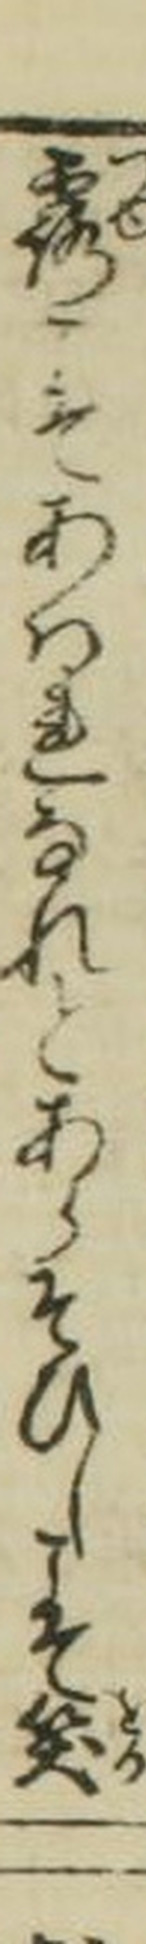露こそあはれなれとあらそひしこそ笑
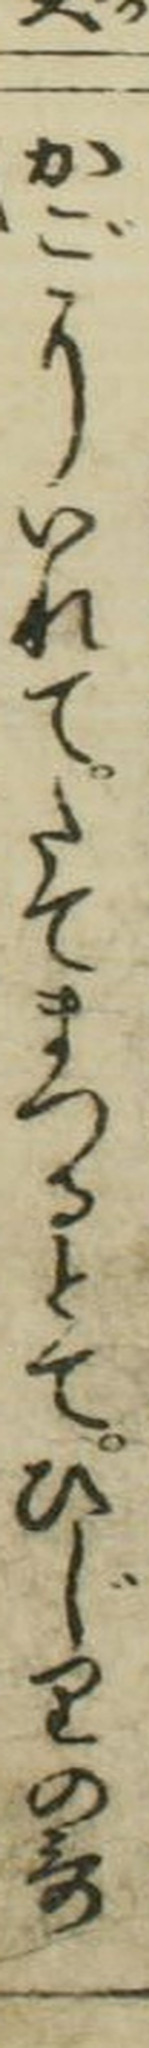かごにいれて。たてまつるとて。ひじりの哥
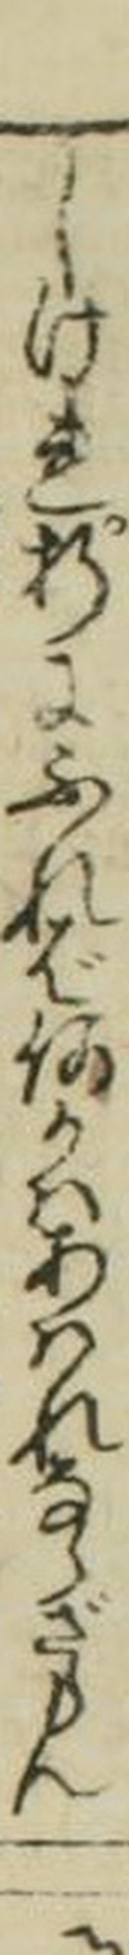しけれ。折にふれば何かはあはれならざらん
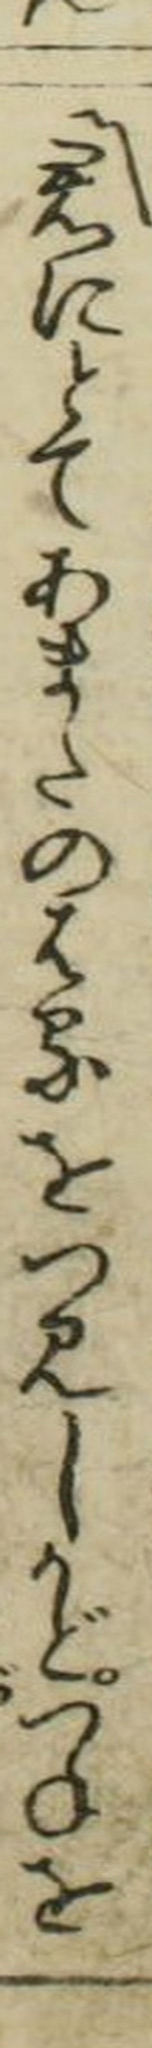〽君にとてあまたのはるをつみしかど。つねを
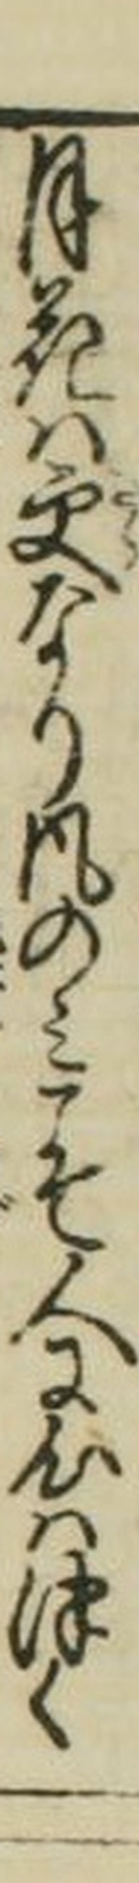月花は更なり風のみこそ人に心はつく
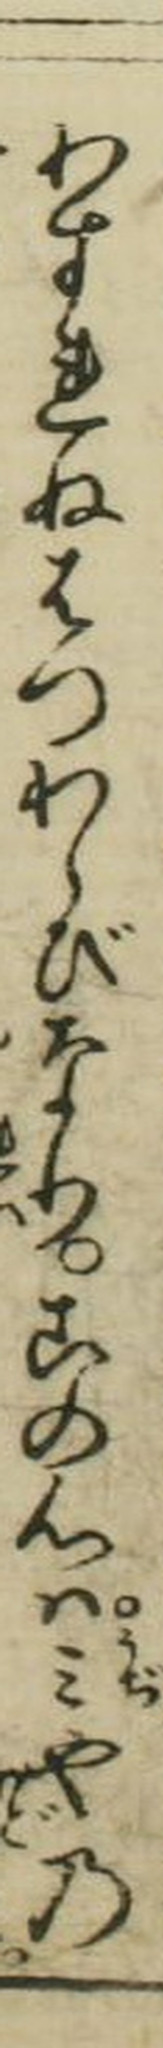わすれぬはつわらびなり。この心は。みやの
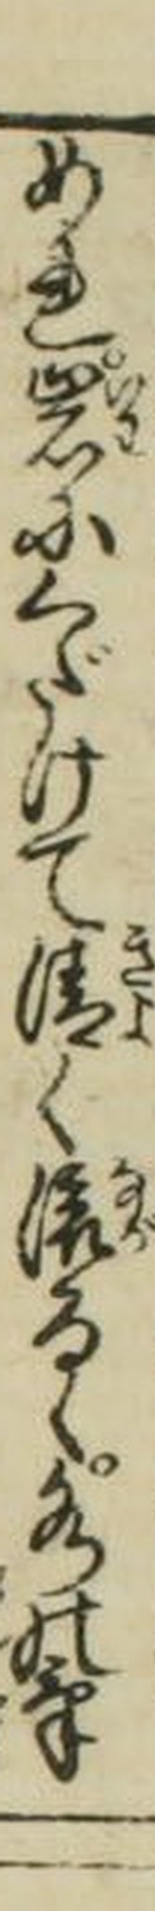めれ。岩にくだけて清く流るゝ。水のけ
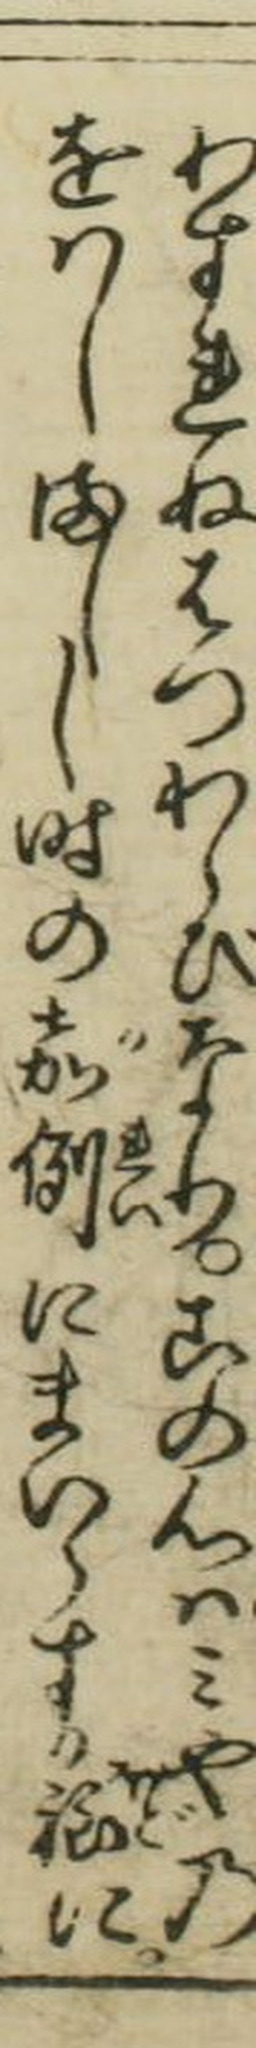をはしましし時の嘉例にまいらする程に。
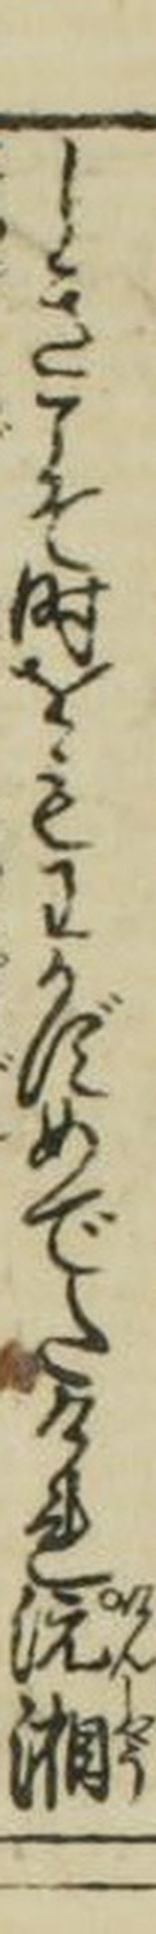しきこそ時をもわかずめでたけれ。沅湘
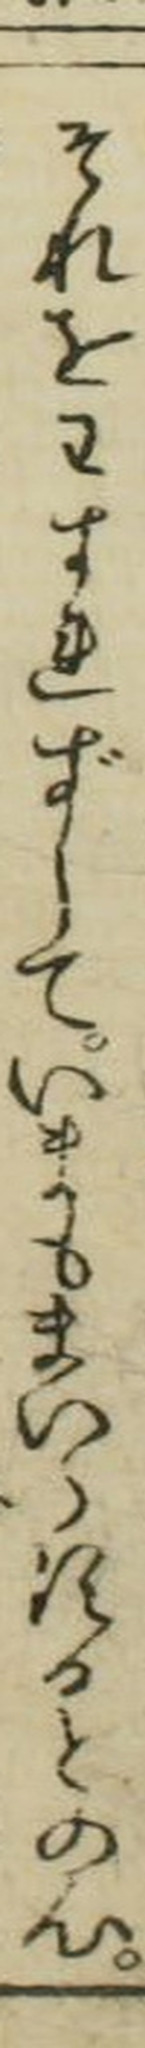それをわすれずして。いまもまいらするとの心。
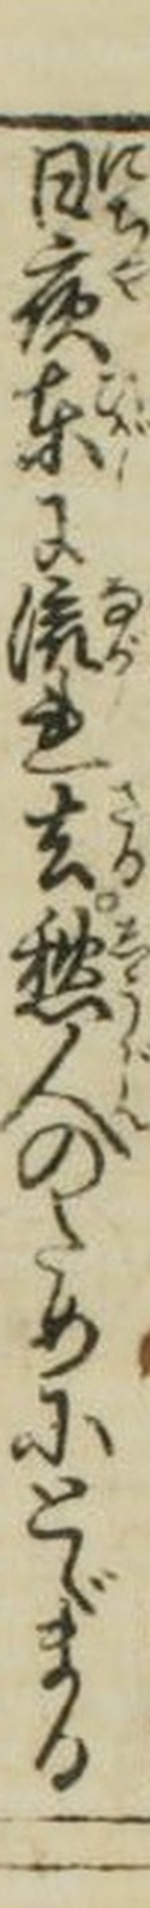日夜東に流れ去。愁人のためにとゞまる
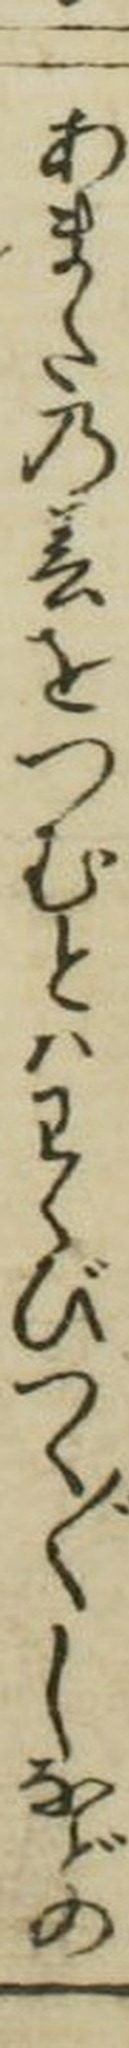あまたの春をつむとはわらびつく〴〵しなどの
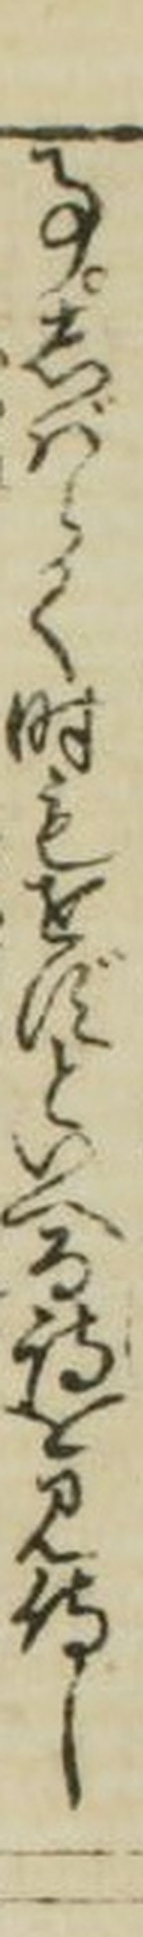事。しばらく時もせずといへる詩を見侍し
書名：女源氏教訓鑑
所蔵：東京学芸大学附属図書館
